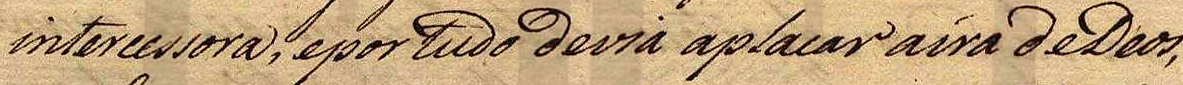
intercessora, e por tudo devia aplacar a íra de Deos,
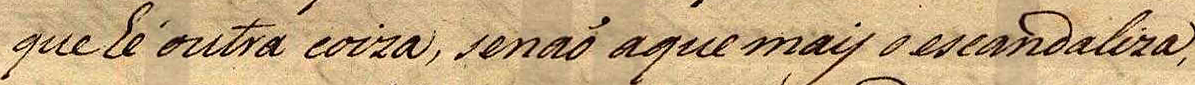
que hé outra coiza, senaõ a que mais escandaliza,
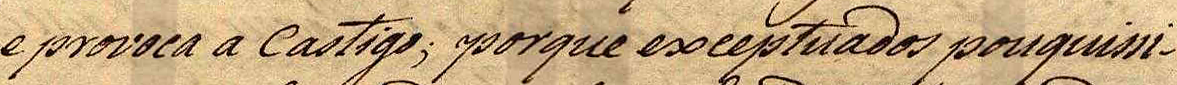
e provoca a castigo; porque exceptuados pouquissi
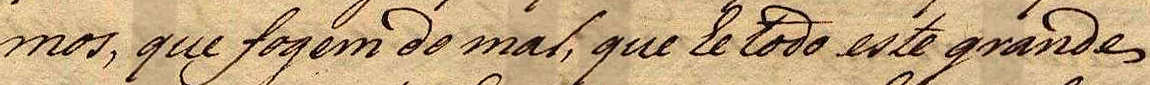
mos, que fogem do mal, que he todo este grande
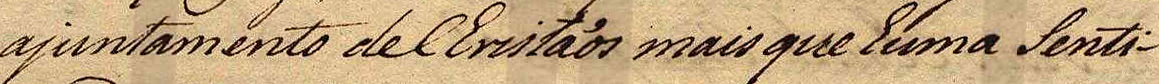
ajuntamento de Christaõs mais que huma senti
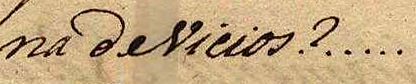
na de Vicios?.....
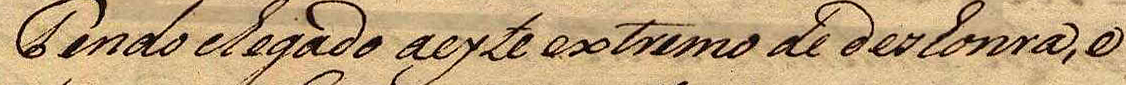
Tendo chegado a este extremo de deshonra, e
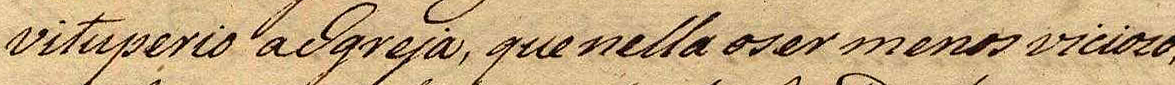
vituperio a Igreja, que nella o ser menos viciozo,
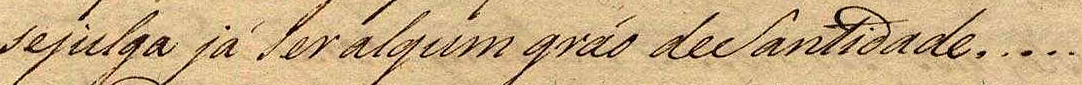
sejulga já ser algum gráo de Santidade.....
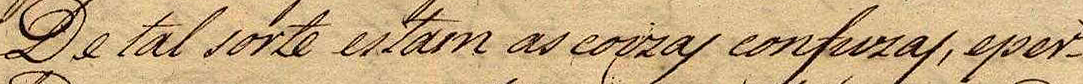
De tal sorte estam as coizas confuzas, e per
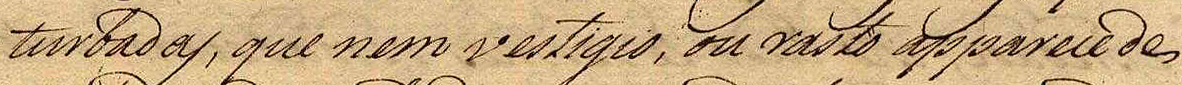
turbadas, que nem vestigio, ou rastro apparece de
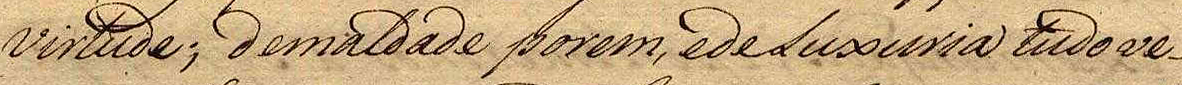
virtude; de maldade porem, e de Luxuria tudo ve
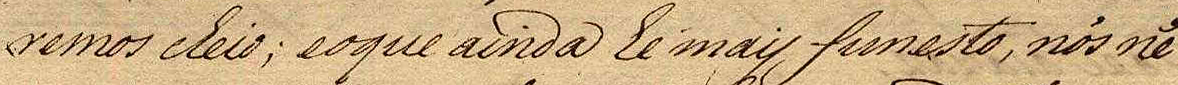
remos cheio; e o que ainda hé mais funesto, nós nẽ
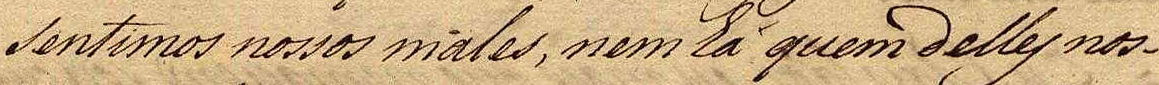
sentimos nossos males, nem há quem delles no
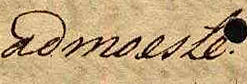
admoeste.
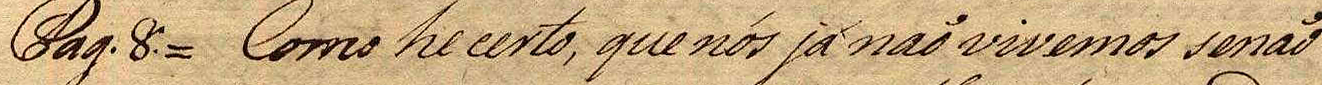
Pag. 8. = Como he certo, que nós já naõ vivemos senaõ
